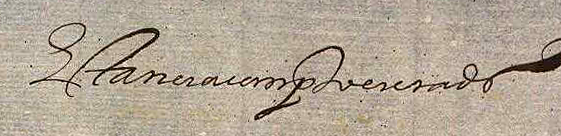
Estancia com procuradr
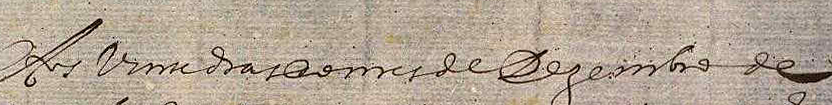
Aos vinte dias do mes de Dezembro de
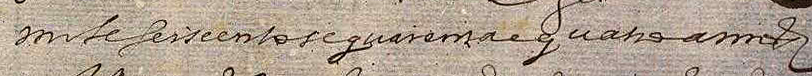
mil e seiscentos e quarenta e quatro annos
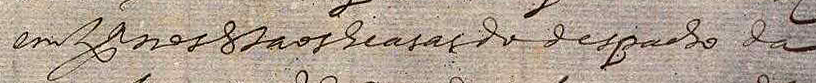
em Lxa nos estaos E casas do despacho da
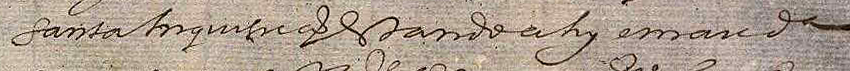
santa Inquisiçaõ estando ahy em auda
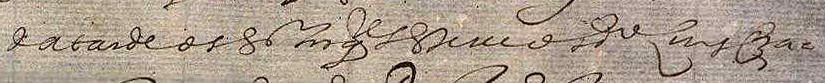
da tarde os srs Inqres esteue o Ldo Luis Cra
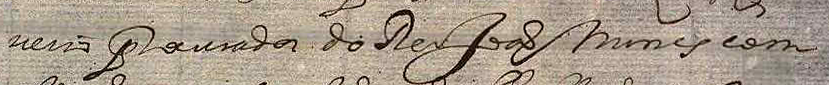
uerio procurador do Reo Joaõ Nunes com
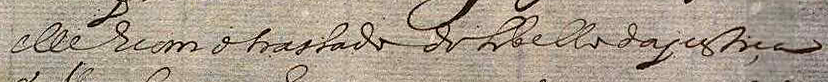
elle E com o traslado do libello da justiça
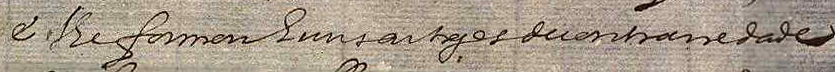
e lhe formou huns artigos de contrariedade
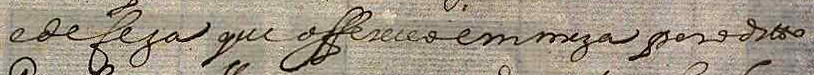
e defeza que offereceo em meza por o ditto
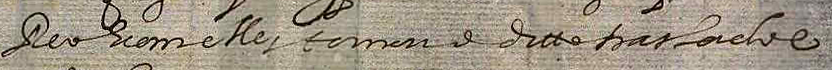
Reo E com elles tomou o ditto traslado e
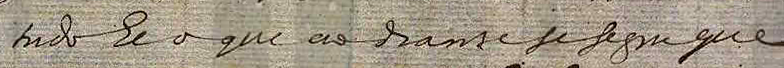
tudo he o que ao diante se segue que
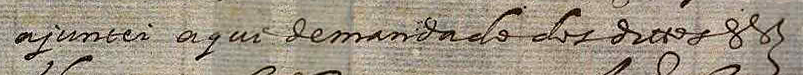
ajuntei aqui de mandado dos dittos ss̄
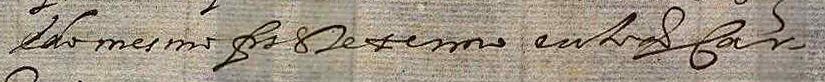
e do mesmo fis este termo eu Ioaõ Car
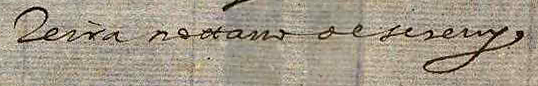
Reira nottario o escreuy
